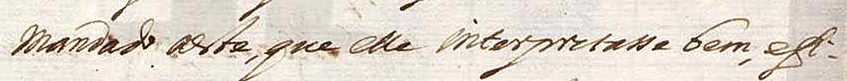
mandado a este, que elle interpretasse bem, e fi
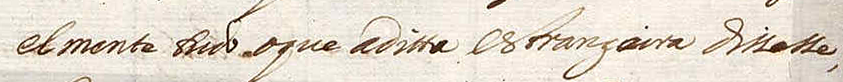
elmente tudo o que a ditta estrangeira dissesse,
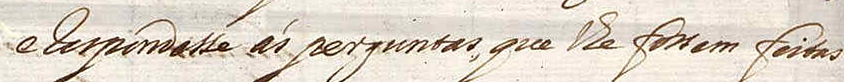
e Respondesse ás perguntas, que lhe fossem feitas
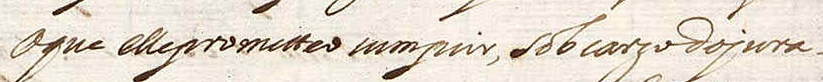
O que elle prometteo cumprir, sob cargo do jura
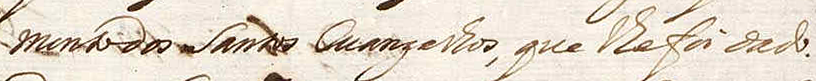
mento dos Santos Euangelhos, que lhe foi dado.
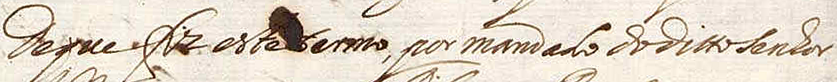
De que fiz este termo, por mandado do ditto Senhor
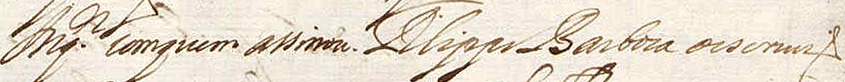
Inq.or com quem assinou. Filippe Barboza o escriuaõ
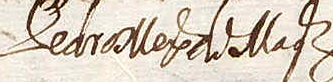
Pedro Mexia de Mag.es
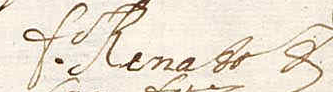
fr. Renato V.
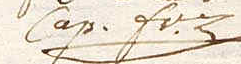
Cap. fr.ez
